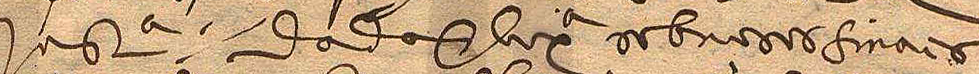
Justa / dada ē lixa sob nosos sinaes
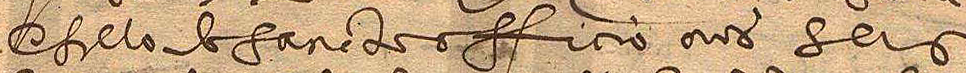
e sello do sancto officio aos seis
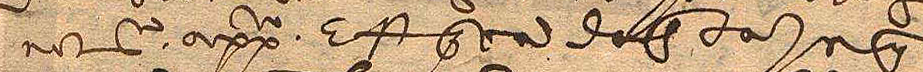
notro. appco. Estp̄vā da s̄ta Jnq̄j
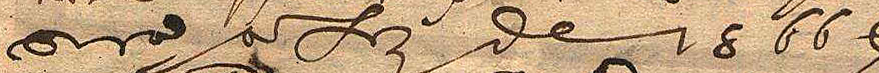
seçā o fez de 1566
